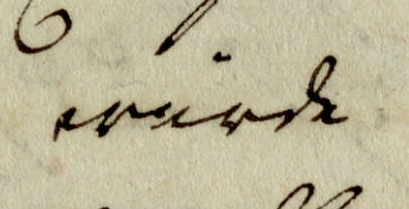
würde
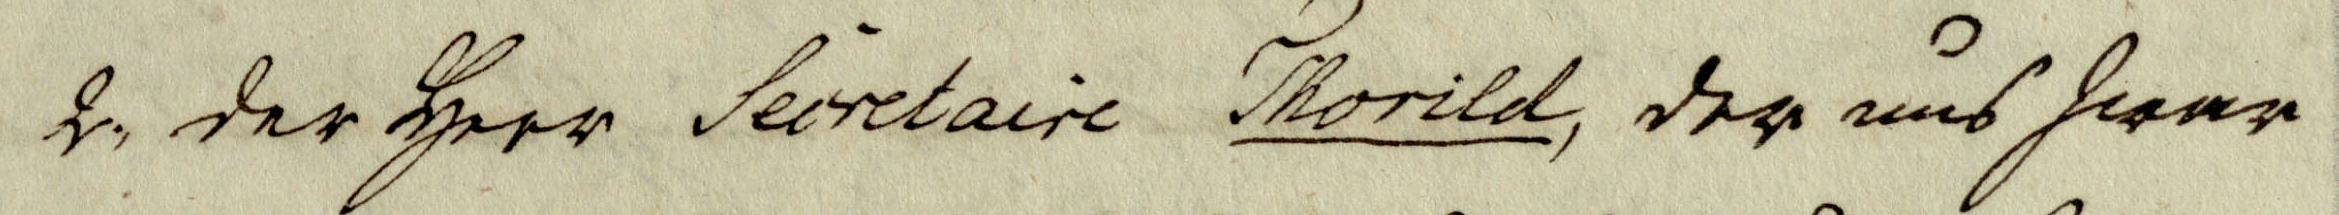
2., der Herr Secretaire Thorild, der und zwar
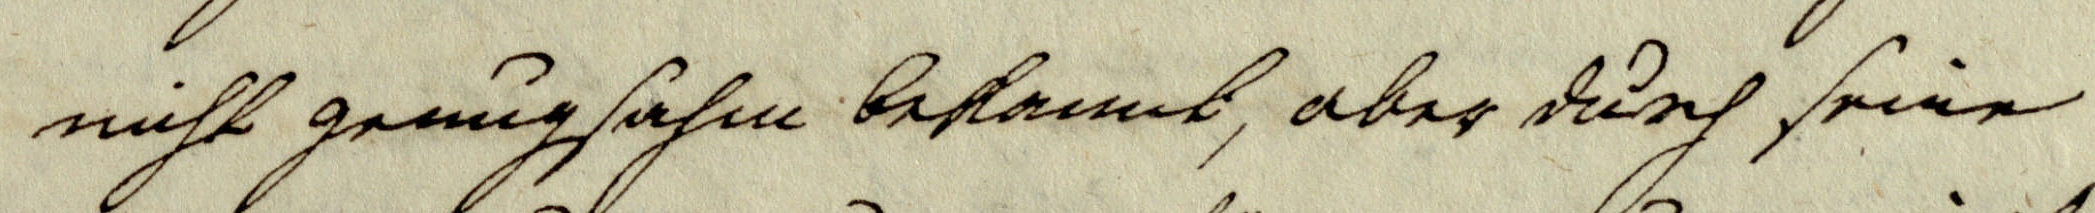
nicht genugsahm bekannt, aber durch seine
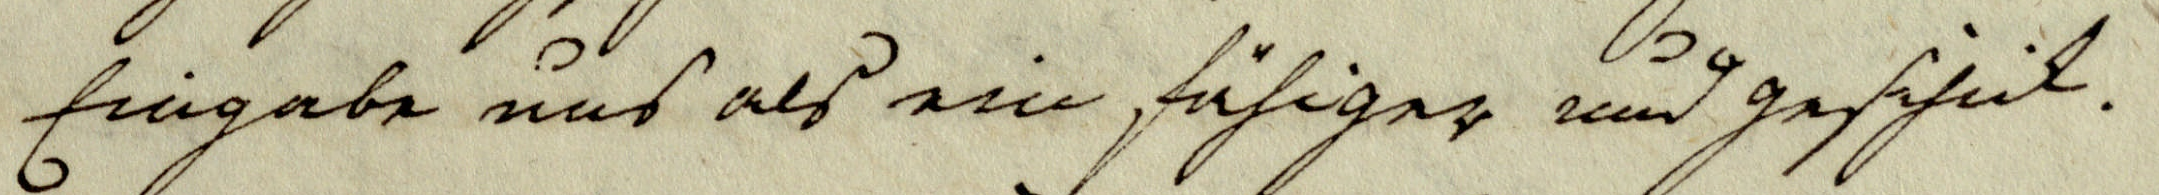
Eingabe uns als ein fähiger und geschick¬
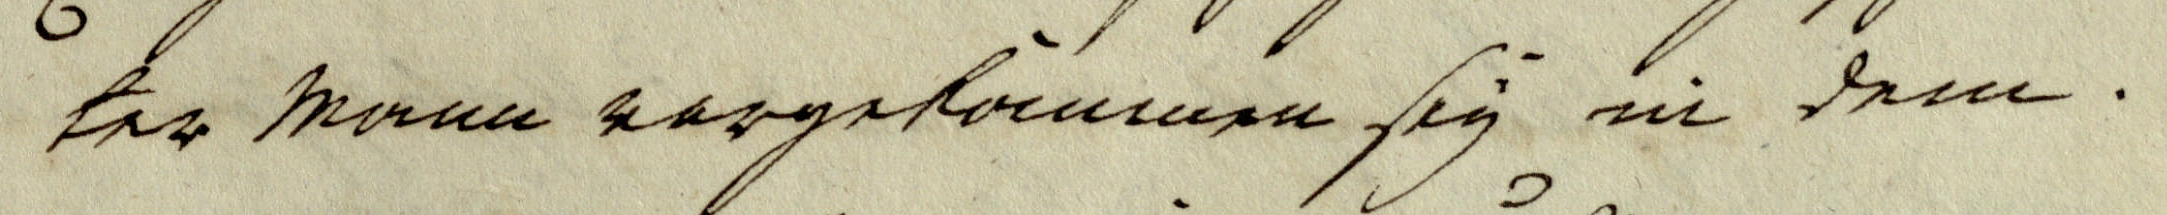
ter Mann vorgekommen seÿ in dem¬
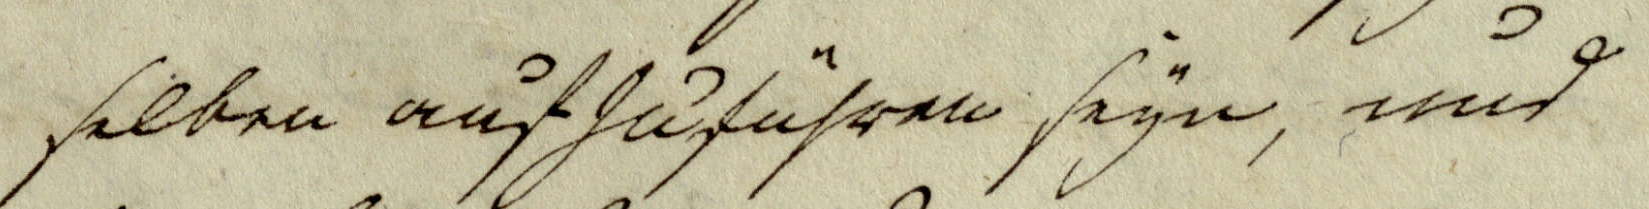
selben aufzuführen seÿn, und
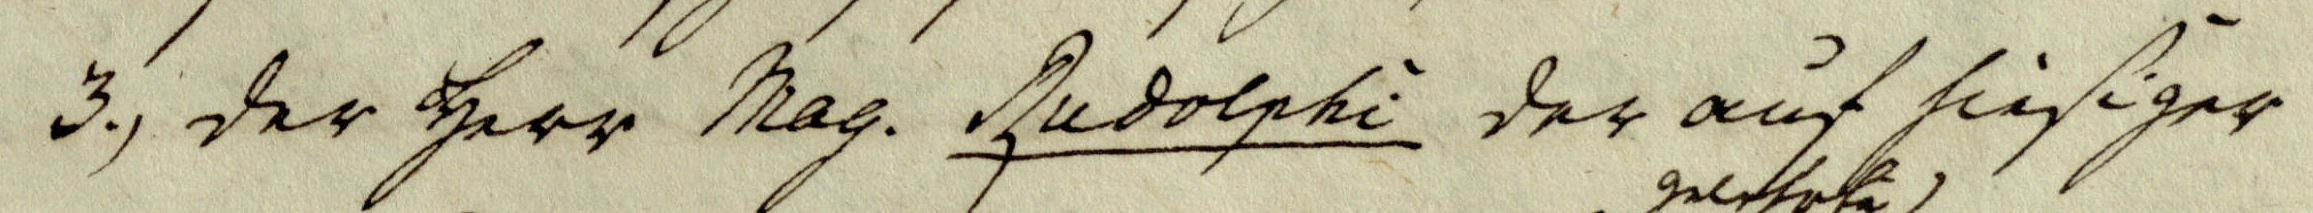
3., der Herr Mag. Rudolphi der auf hiesiger
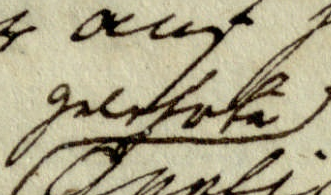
gelehrte
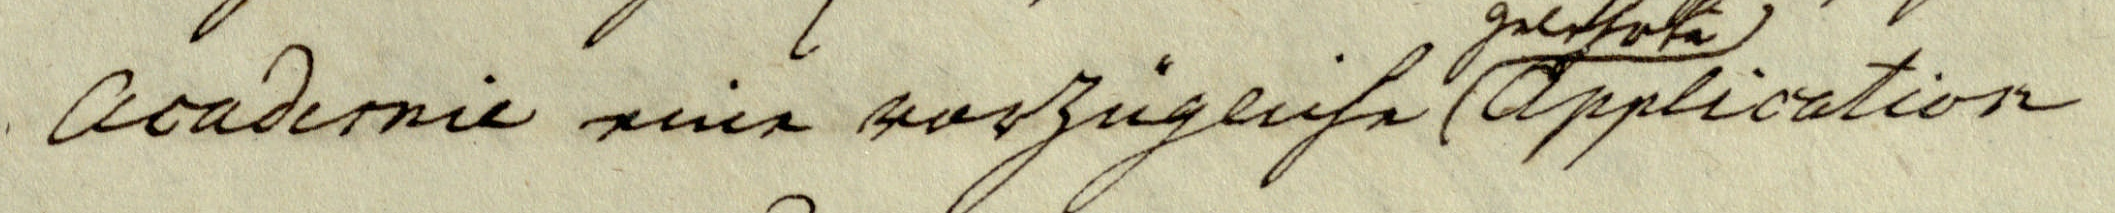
Academie eine vorzügliche Application
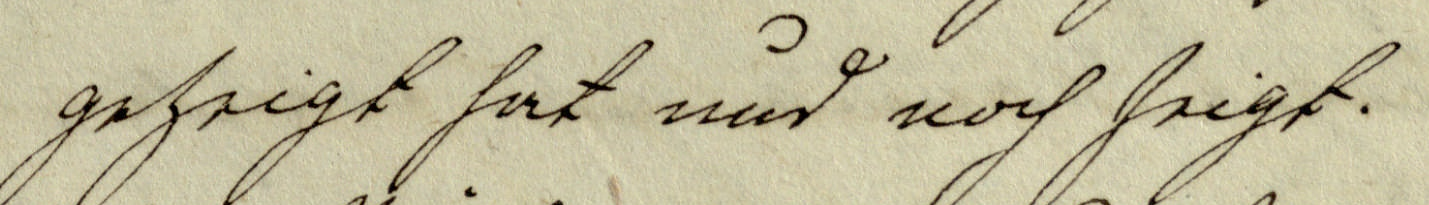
gezeigt hat und noch zeigt.
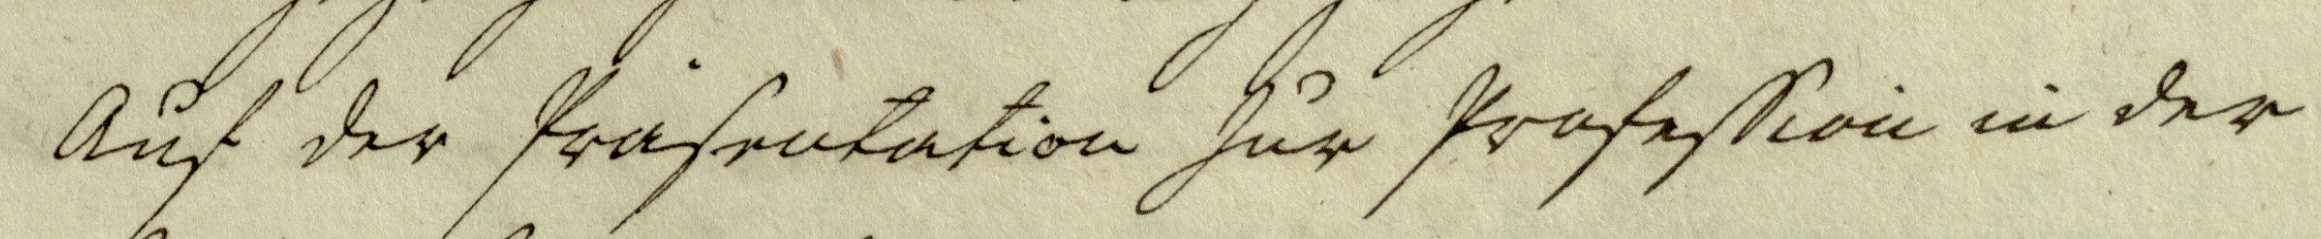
Auf der Präsentation zur Profession in der
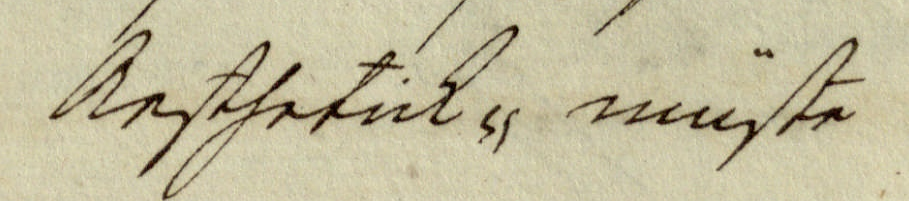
Aesthetick müsste
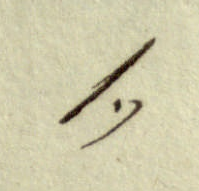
1.,
